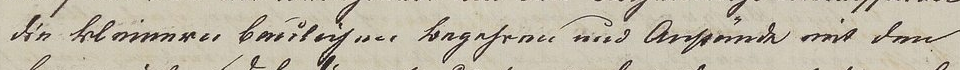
die kleinern baulichen Begehren und Anstände mit den
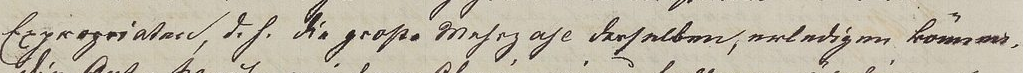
Expropriaten, d. h. die große Mehrzahl derselben, erledigen können.
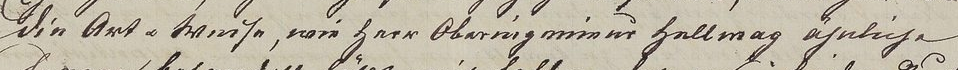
Die Art & Weise, wie Herr Oberingenieur Hellwag ähnliche
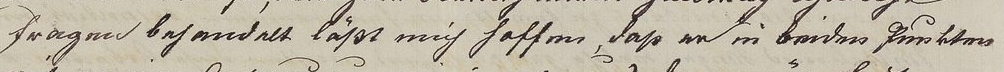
Fragen behandelt läßt mich hoffen, daß er in beiden Punkten
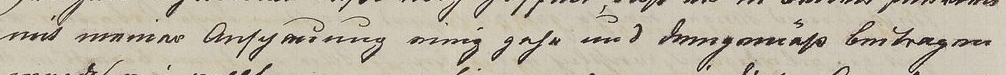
mit meiner Anschauung einig gehe und demgemäß beitragen
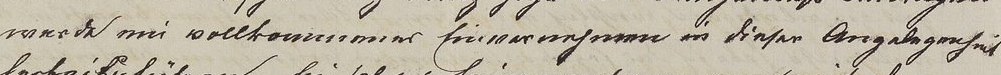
werde ein vollkommenes Einvernehmen in dieser Angelegenheit
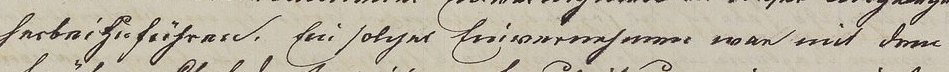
herbeizuführen. Ein solches Einvernehmen war mit dem
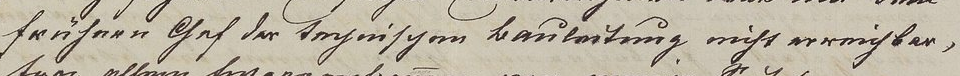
frühern Chef der technischen Bauleitung nicht erreichbar,
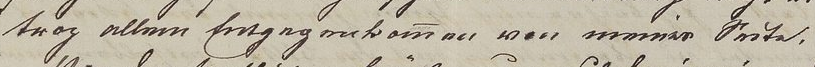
troz allem Entgegenkommen von meiner Seite.
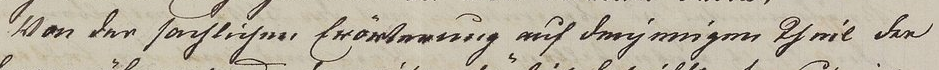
Von der sachlichen Erörterung auf denjenigen Theil der
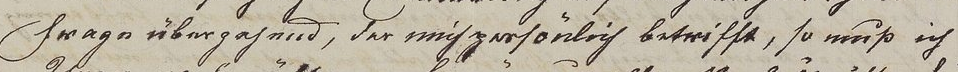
Frage übergehend, der mich persönlich betrifft, so muß ich
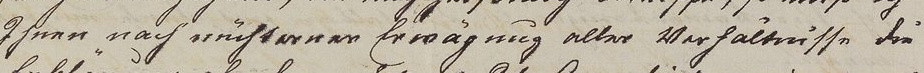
Ihnen nach nüchterner Erwägung aller Verhältnisse die
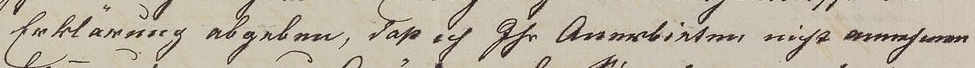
Erklärung abgeben, daß ich Ihr Anerbieten nicht annehmen
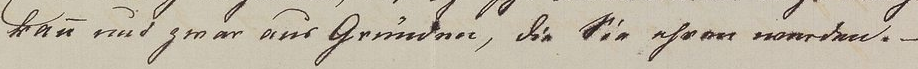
kann und zwar aus Gründen, die Sie ehren werden. –
